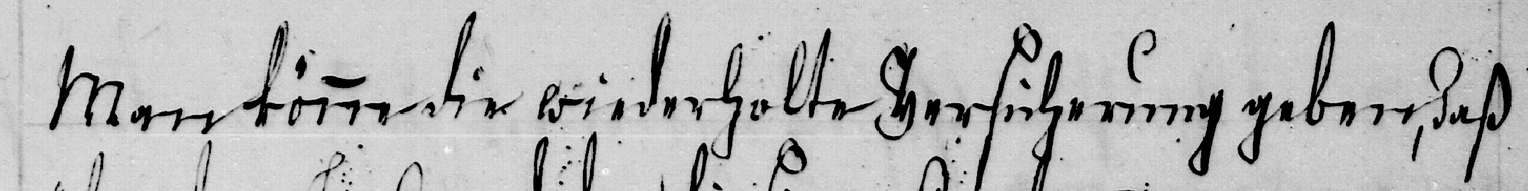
Man könne die wiederholte Versicherung geben, daß
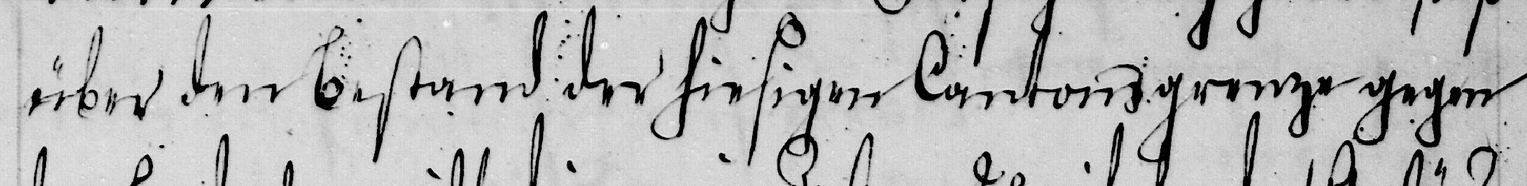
über den Bestand der hiesigen Cantonsgrenze gegen
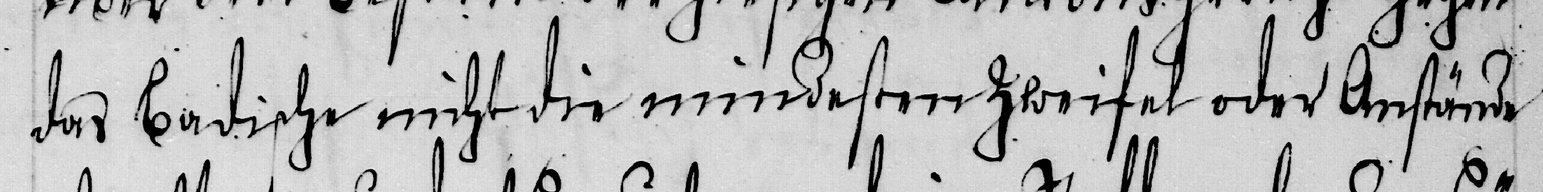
das Badische nicht die mindesten Zweifel oder Anstände
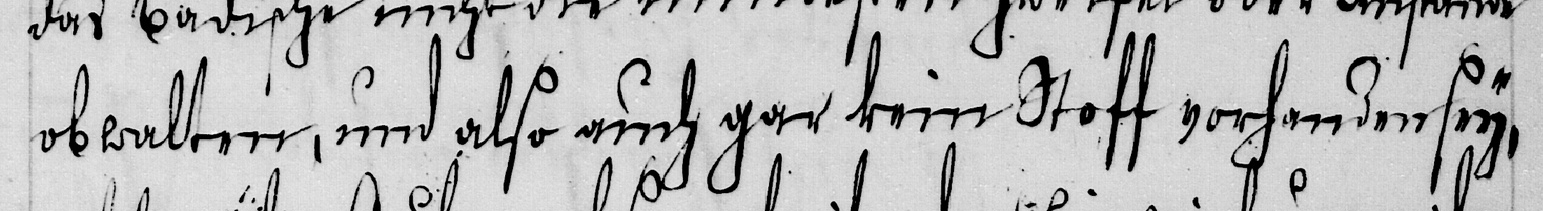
obwalten, und also auch gar kein Stoff vorhanden sey,
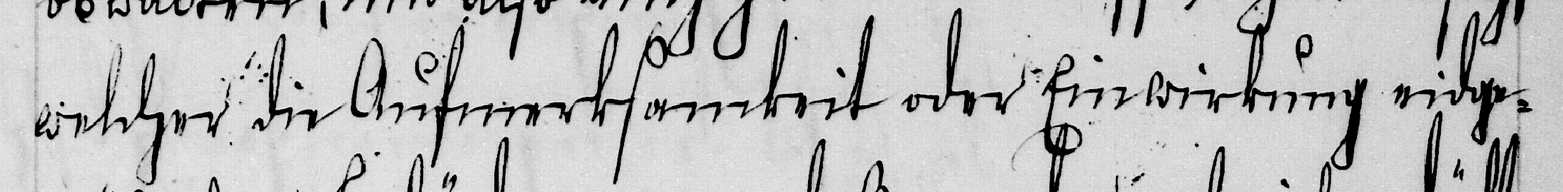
welcher die Aufmerksamkeit oder Einwirkung eidge¬
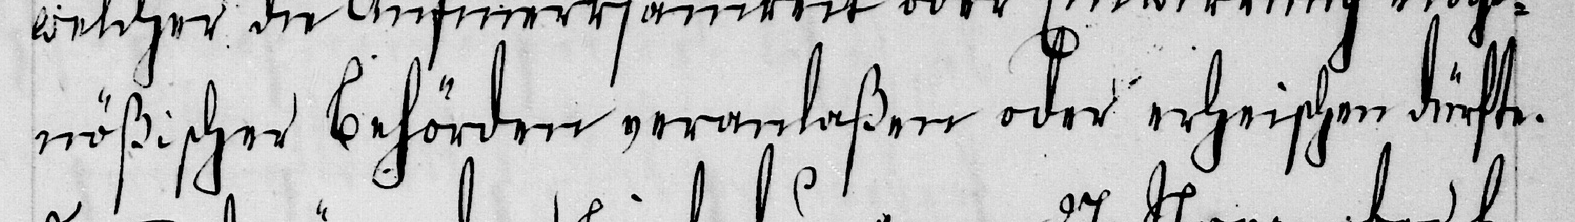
nößischer Behörden veranlaßen oder erheischen dürfte.
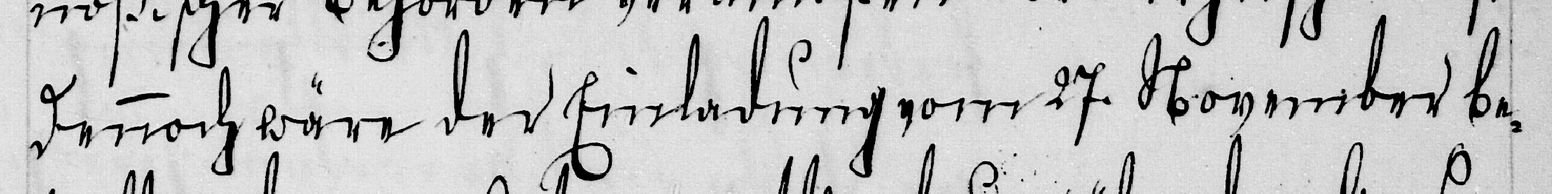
Dennoch wäre der Einladung vom 27. November be¬
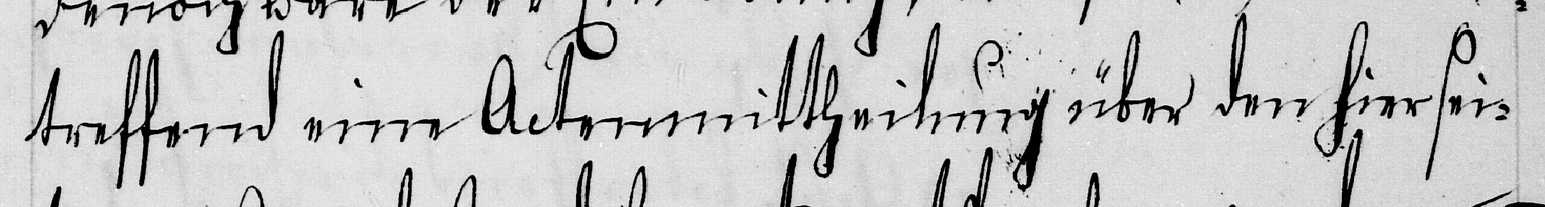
treffend eine Actenmittheilung über den hiersei¬
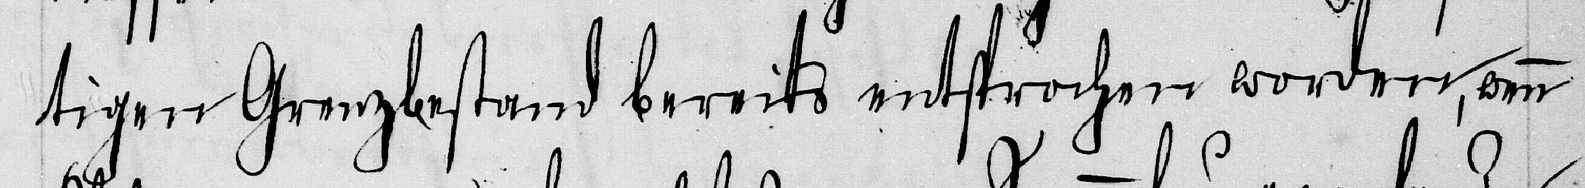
tigen Grenzbestand bereits entsprochen worden, wenn
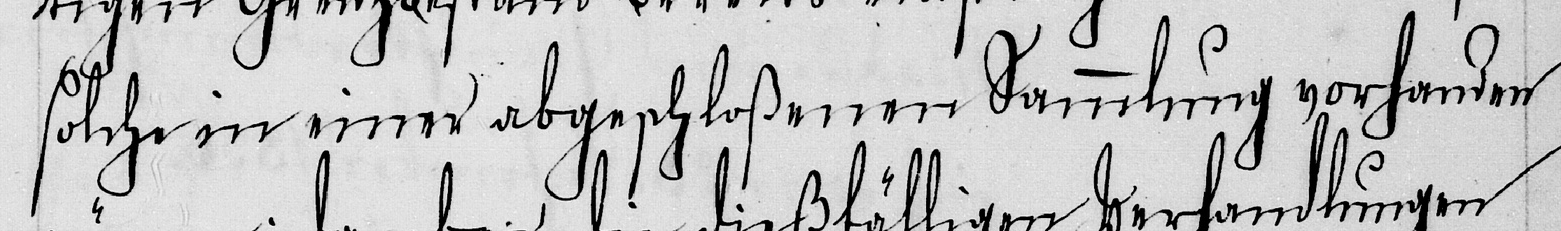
solche in einer abgeschloßenen Sammlung vorhanden
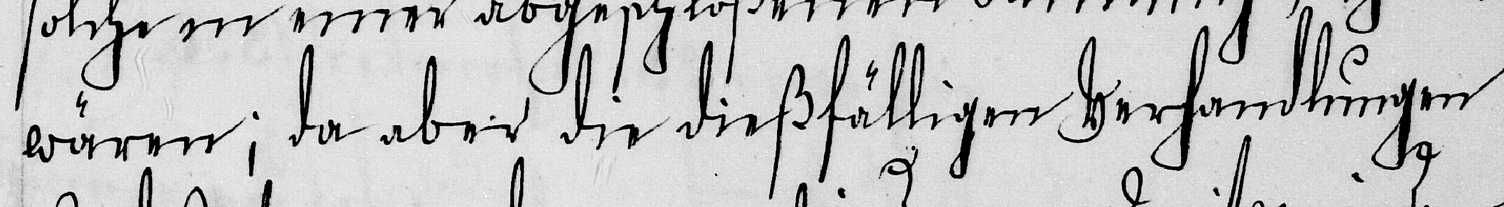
wären: da aber die dießfälligen Verhandlungen
